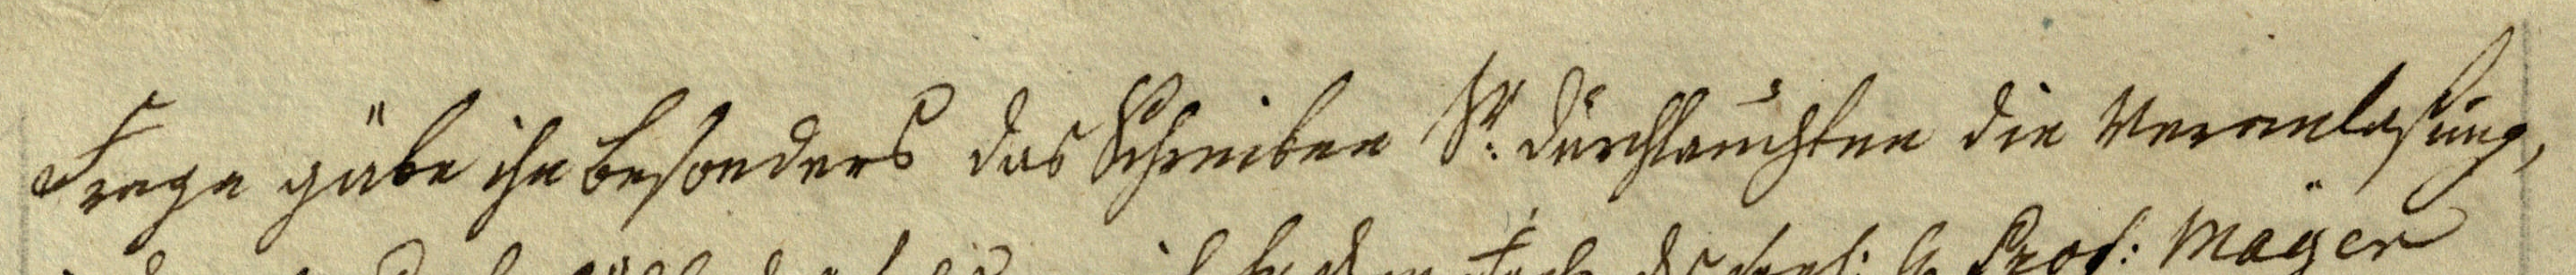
Frage gäbe ihn besonders das Schreiben S. Durchlauchten die Veranlaßung,
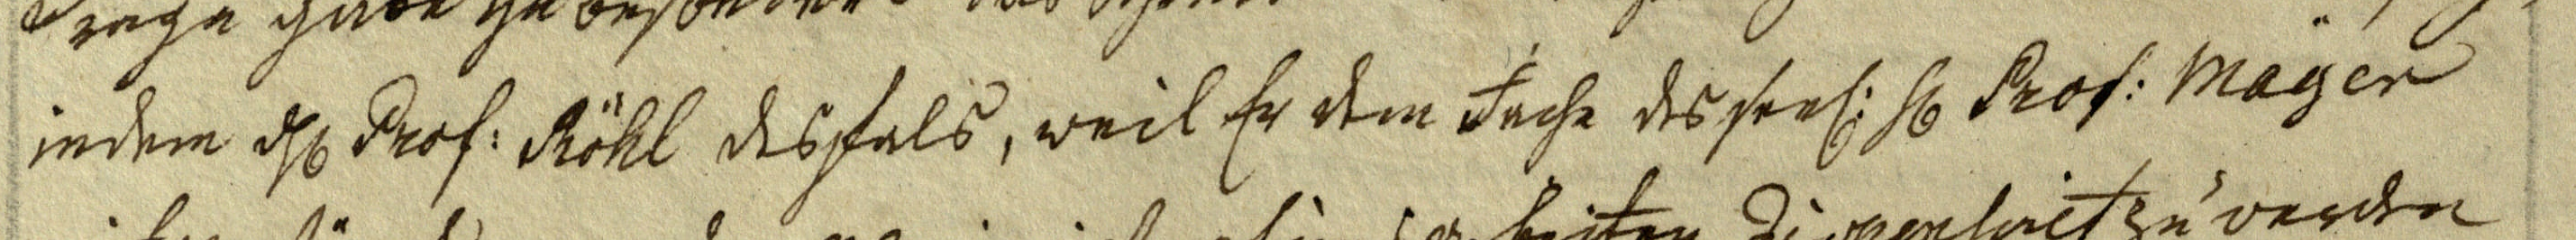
indem dh Prof. Röhl desfals, weil Er dem Fache des seel. H Prof. Maÿer
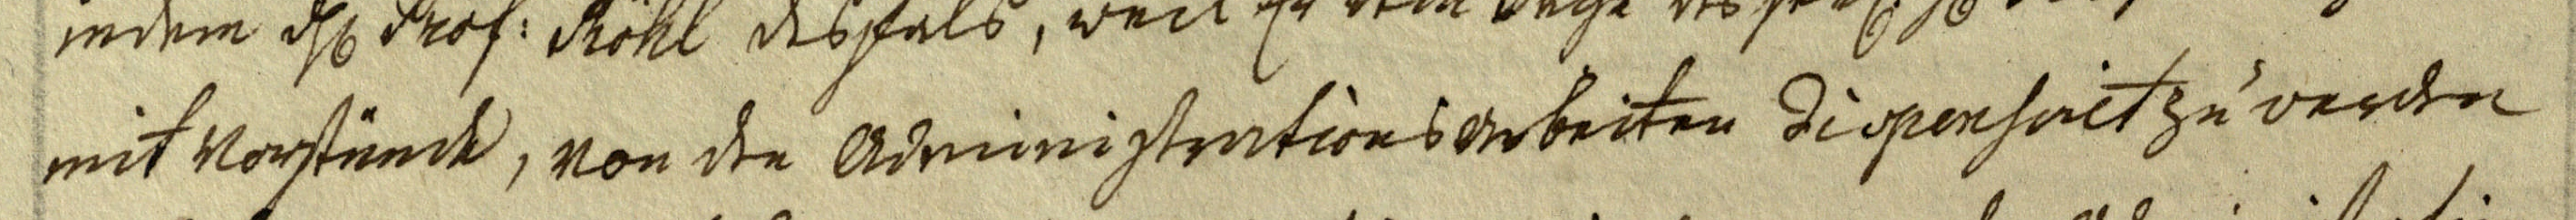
mit vorstünde, von den Administrations Arbeiten dispensiret zu werden
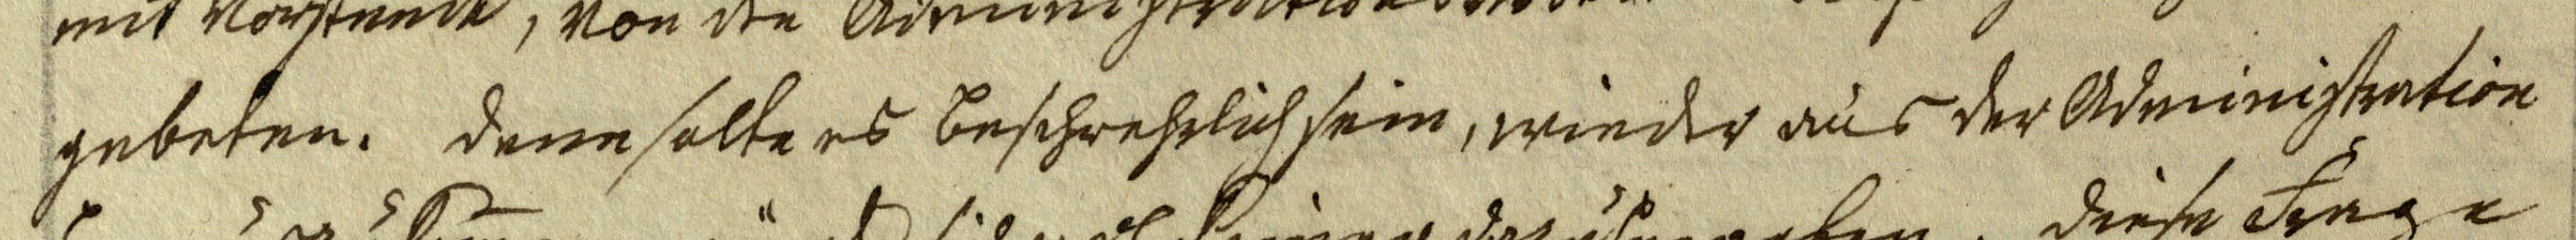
gebeten. denn solte es beschwehrlich sein, wieder aus der Administration
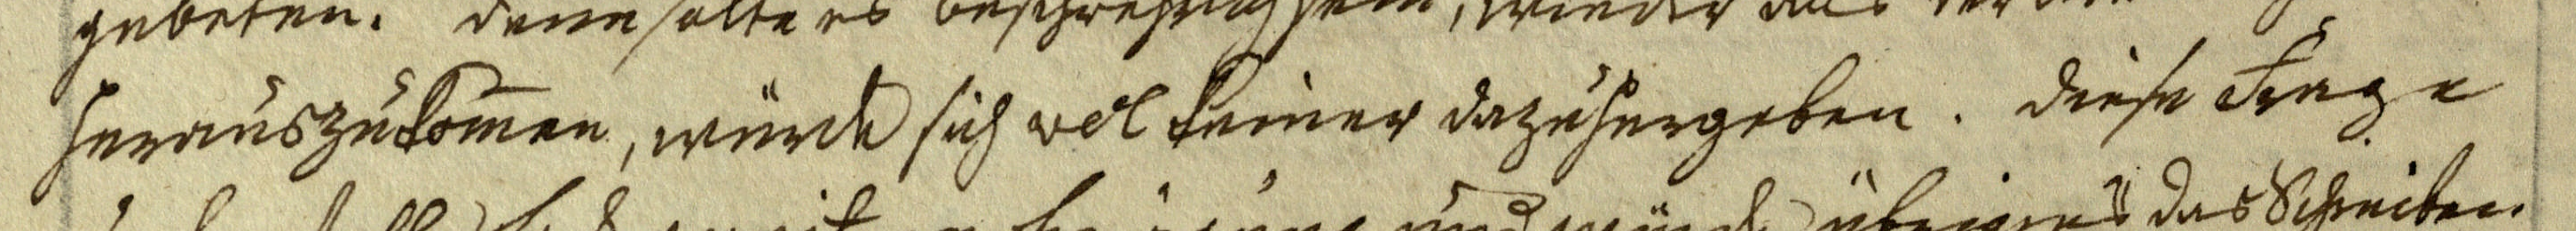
herauszukomen, würde sich wol keiner dazuhergeben. diese Frage
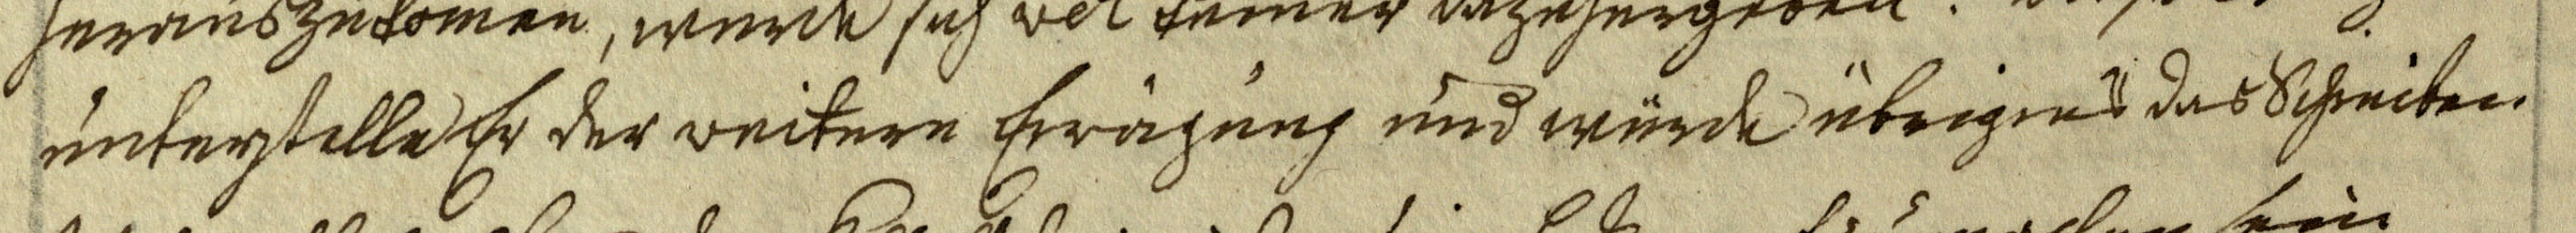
unterstelle Er der weitern Erwägung und würde übrigens das Schreiben
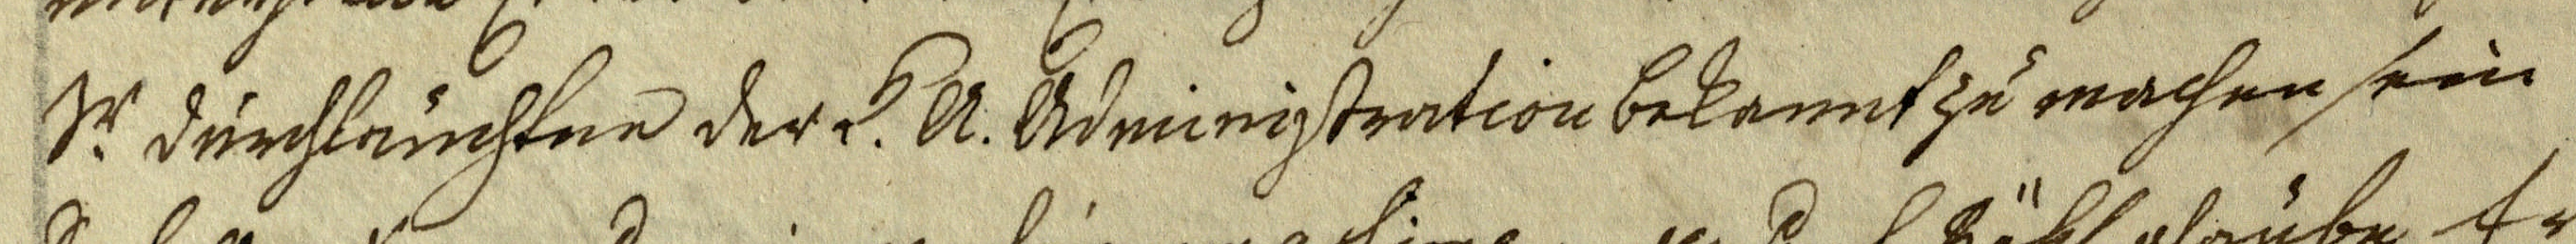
Sr Durchlauchten der K. A. Administration bekannt zu machen sein.
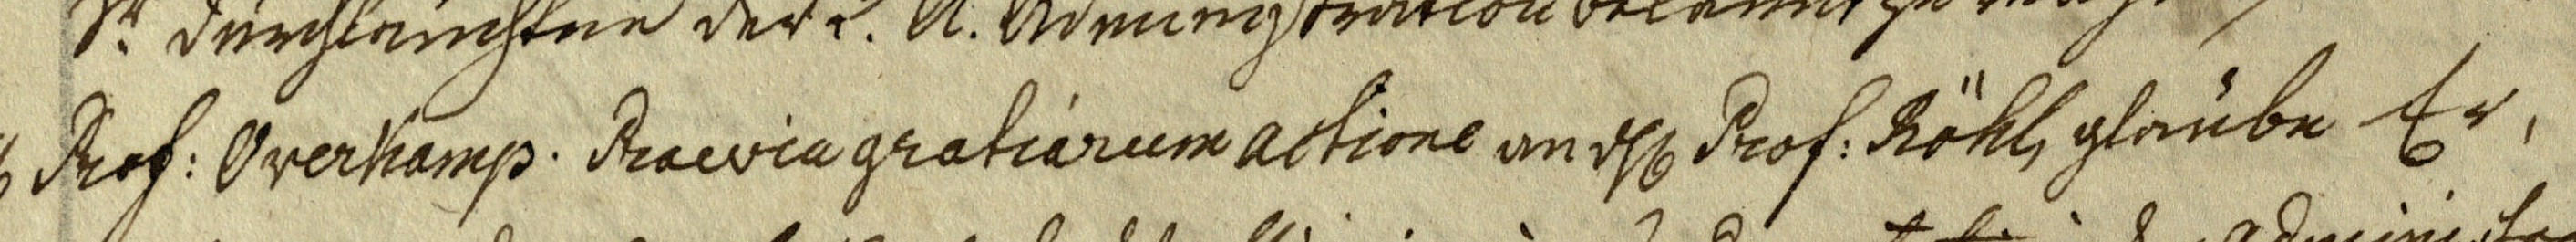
Prof. Overkamp. Praevia gratiarum actione an dh Prof. Köhl glaube Er,
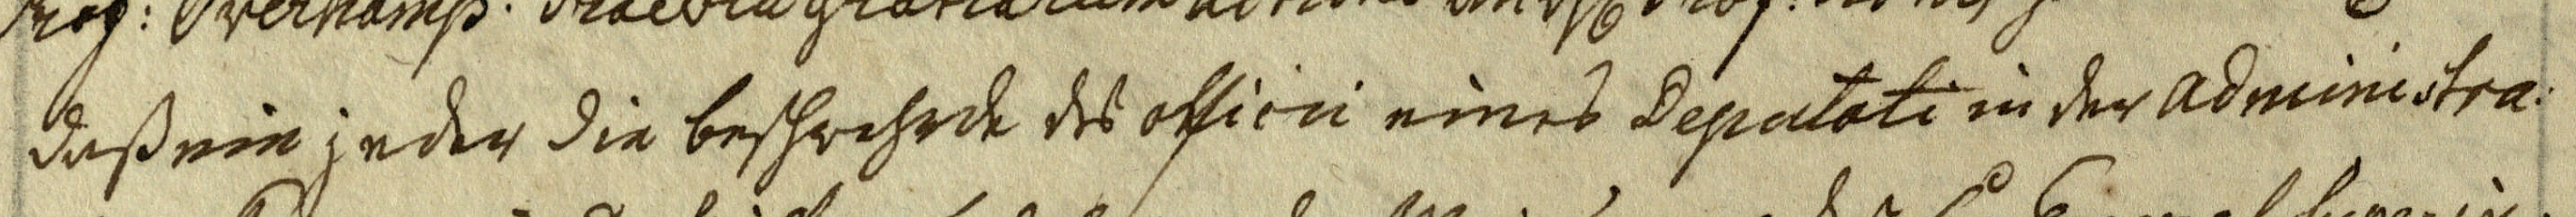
daß ein jeder die Beschwehrde des officii eines Deputati in der Administra¬
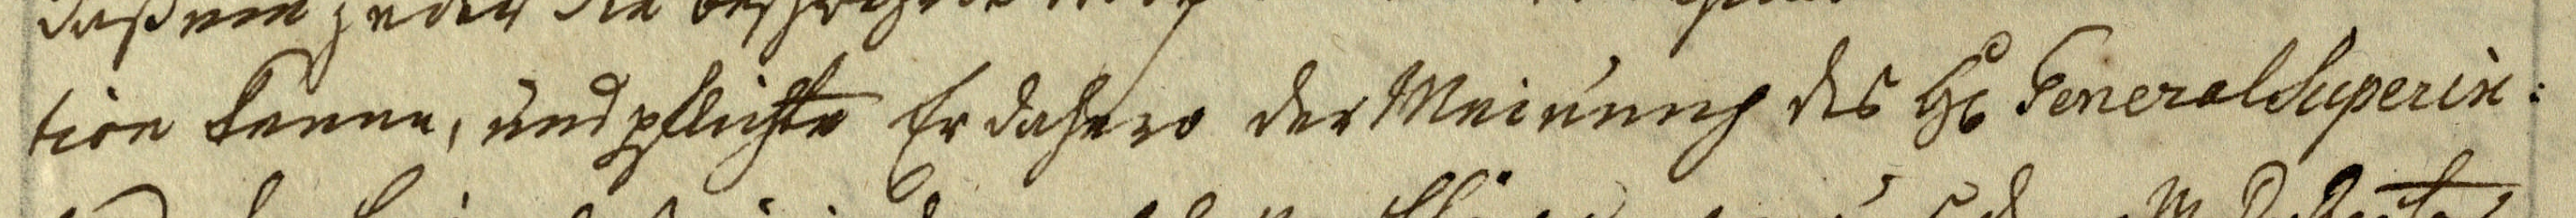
tion kenne, und pflichte Er dahero der Meinung des H GeneralSuperin¬
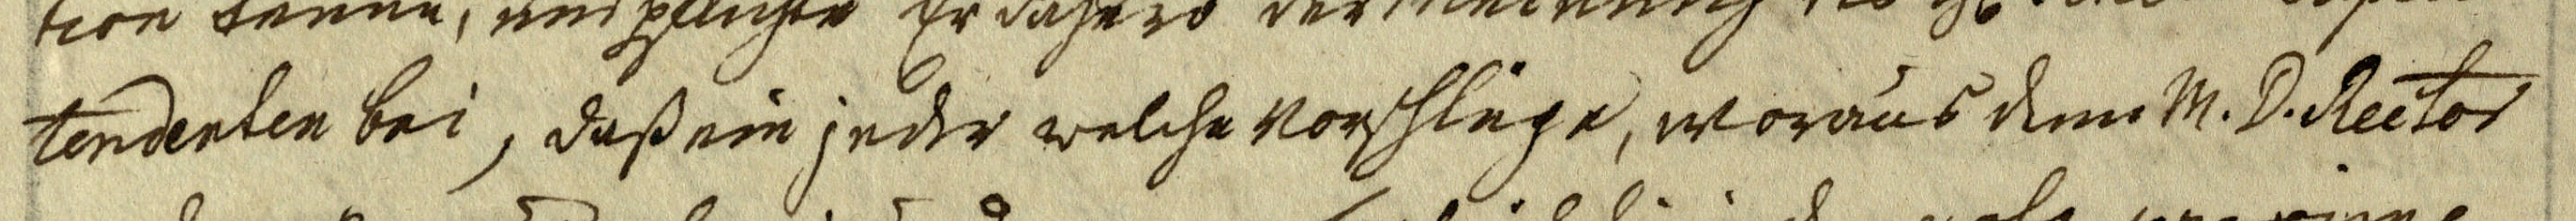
tendenten bei, daß ein jeder welche vorschlüge, woraus denn M. D. Rector
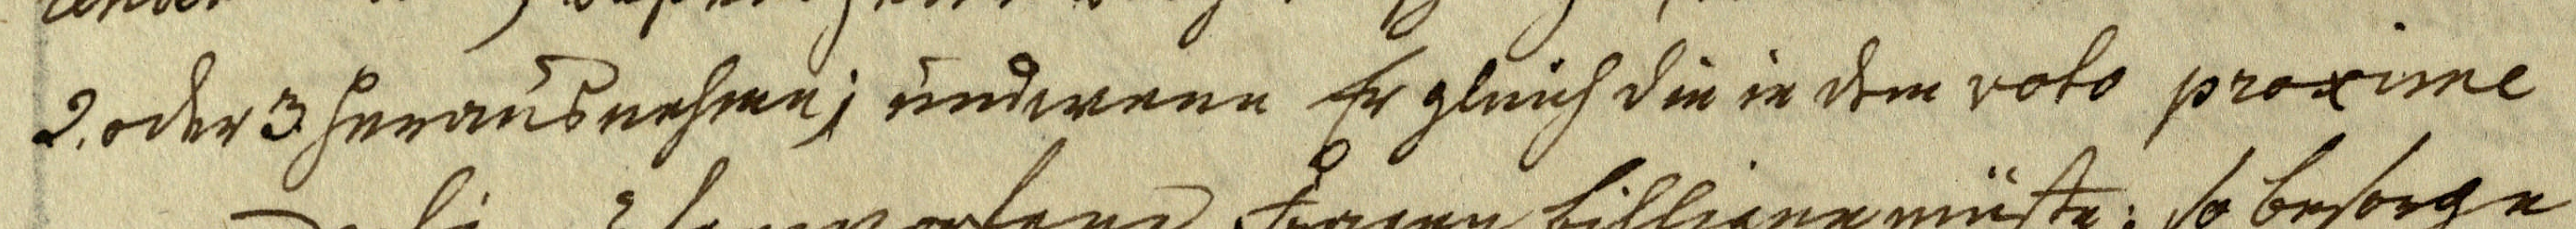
2. oder 3 herausnehme, und wenn Er gleich die in dem voto proxime
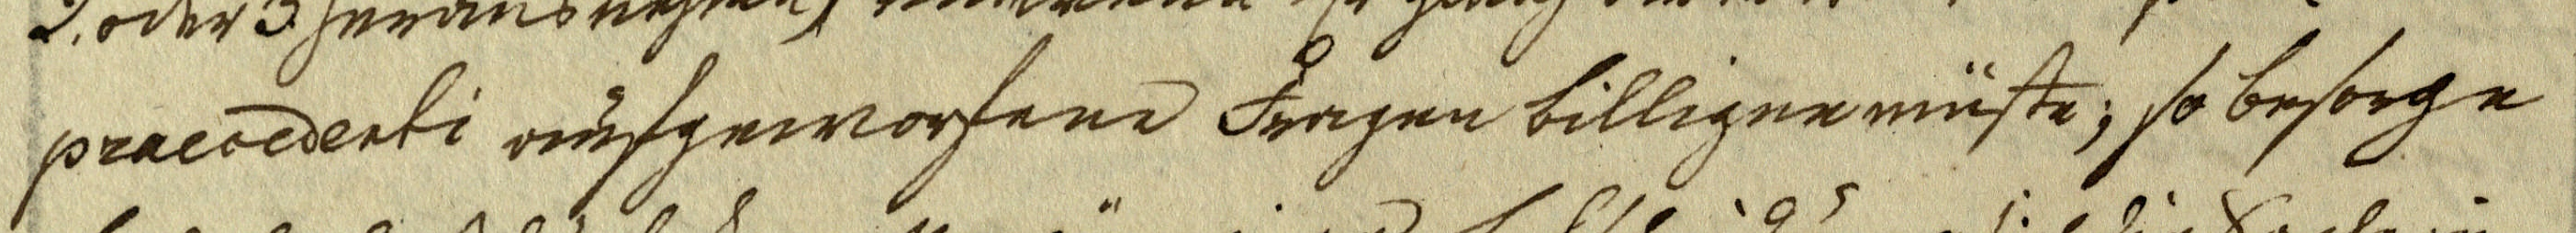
praecedenti aufgeworfene Fragen billigen müßte, so besorge
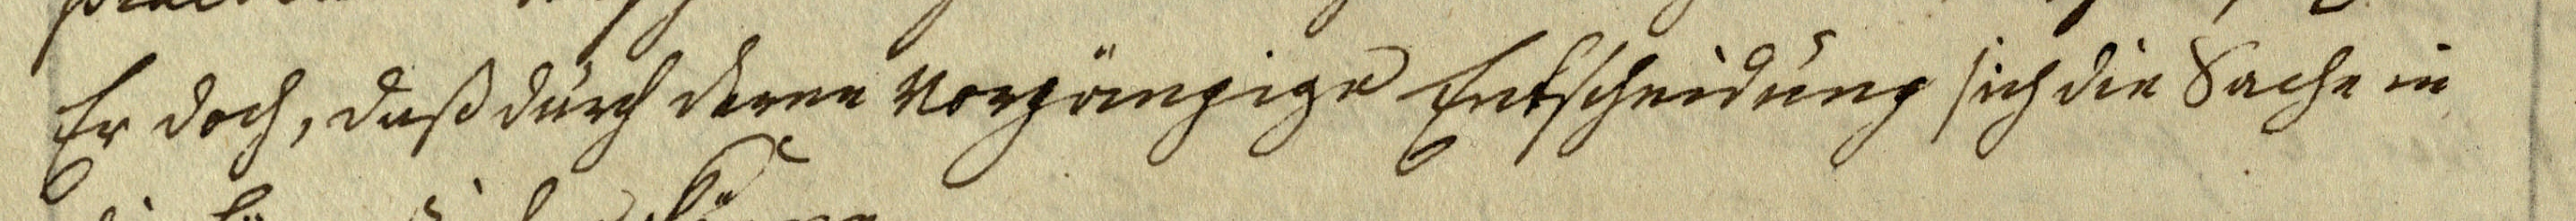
Er doch, daß durch deren vorgängige Entscheidung sich die Sache in
